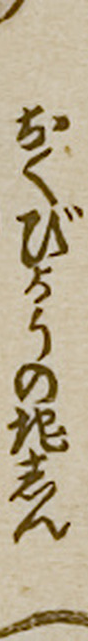おくびようの地しん
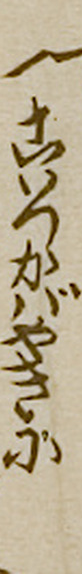〽こいつかばやきに
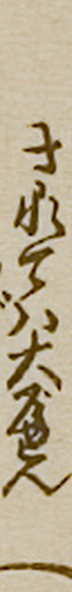されては大へん
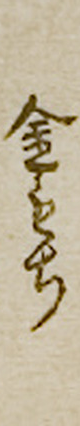金もち
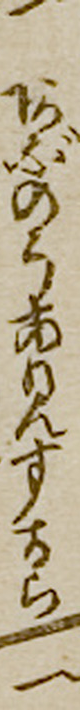〽あぶのうありんすから
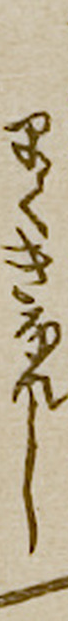早くきなんし
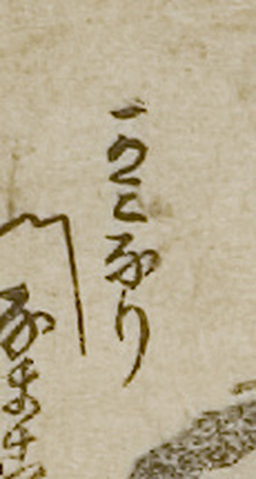かみなり
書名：なまづ蒲やき
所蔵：東京大学総合図書館 General Library in the University of Tokyo, JAPAN
